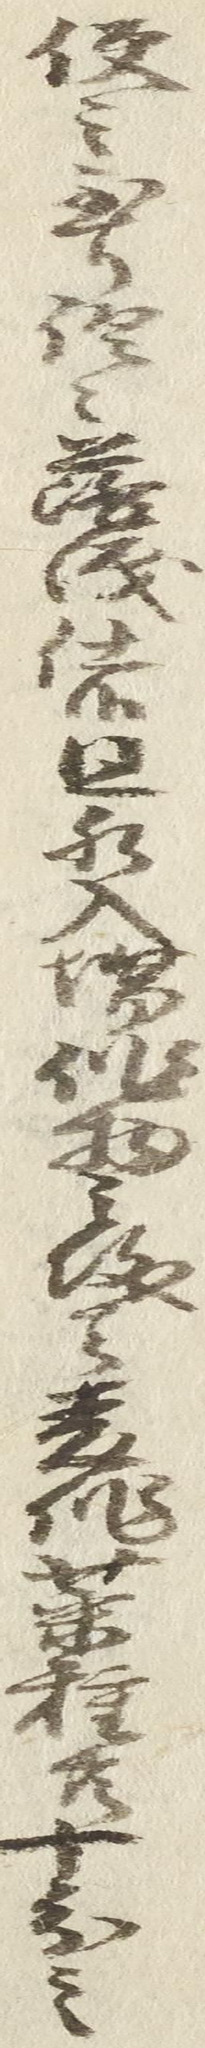便之至り侭々落涙仕候且水入場作物之儀は麦作菜種共十分之
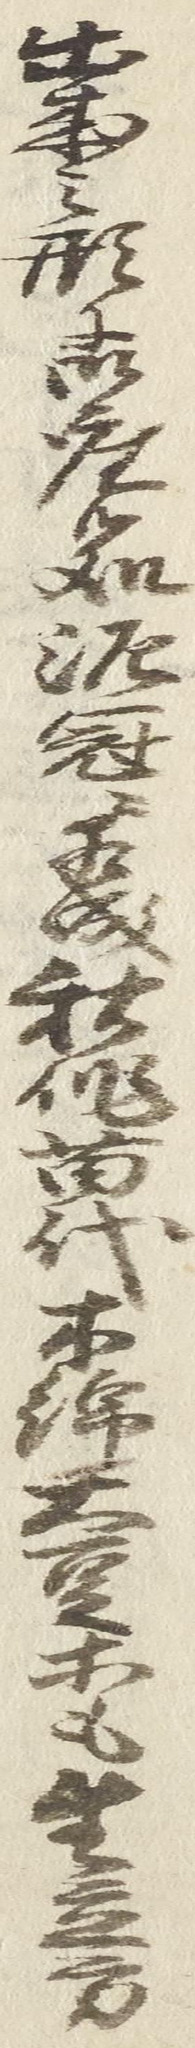出来之形に御座候処泥冠二相成枯作苗代木綿大豆等も生立方
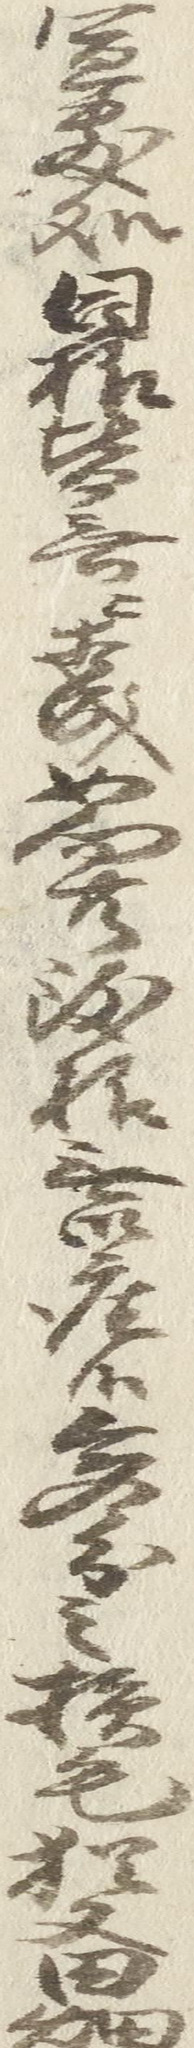宜敷同様皆無二相残如何共致様無御座候多分之損毛猶又田畑
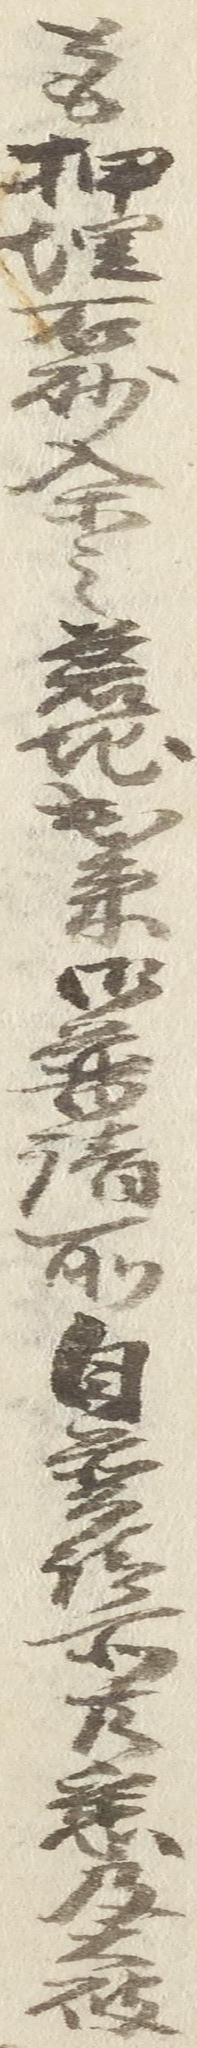とも押埋石砂入等之荒地出来御普請所自普請所共悉及大破
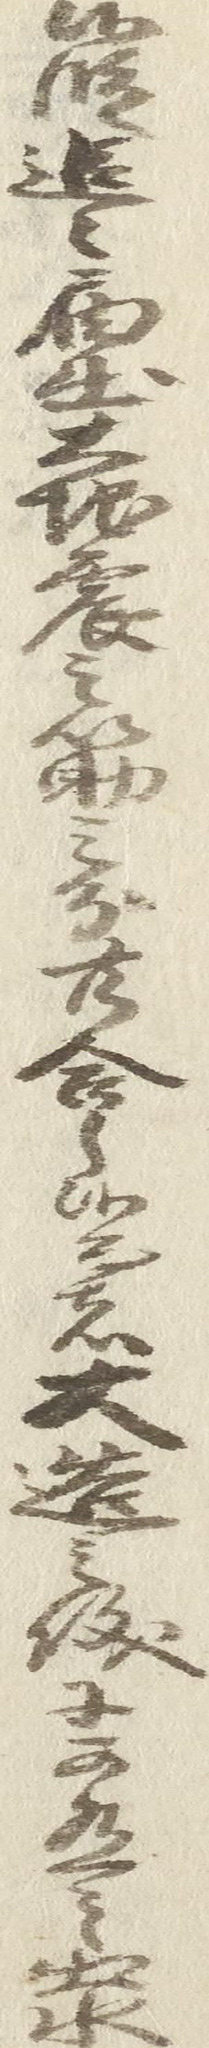候段追々届出大地震之筋之分共合候而は大造之儀二可有之出水
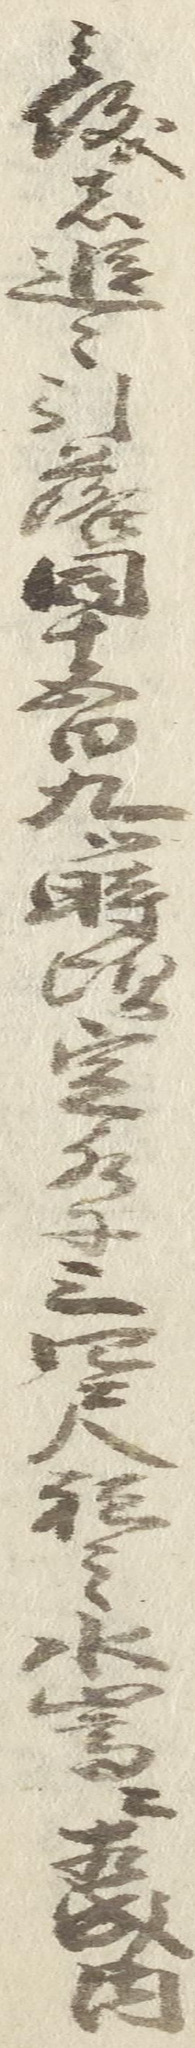之儀は追々引落同十五日昼九ッ時頃定水に三四尺程之水嵩二相成内
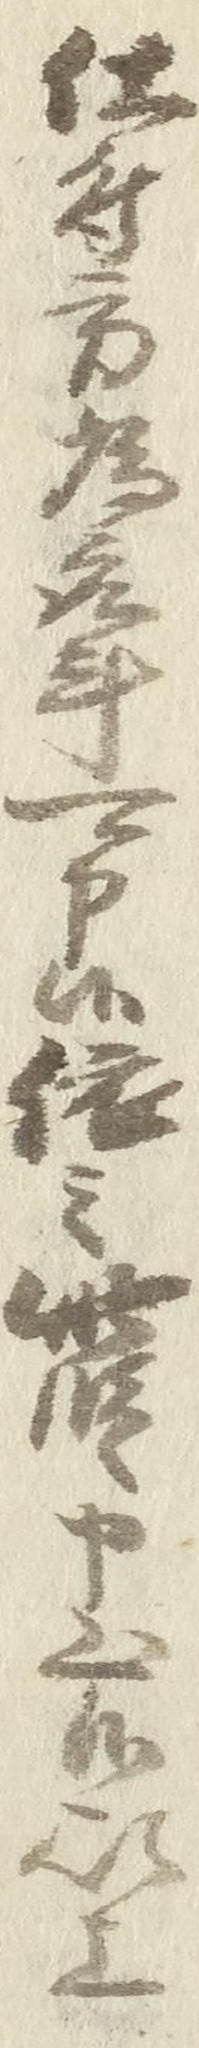為取斗可申候依之此段申上候以上

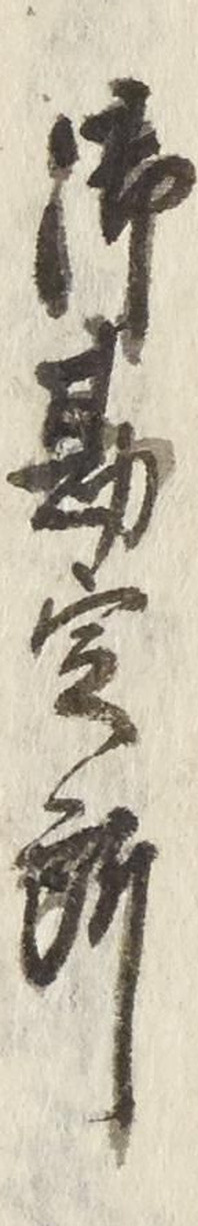御勘定所
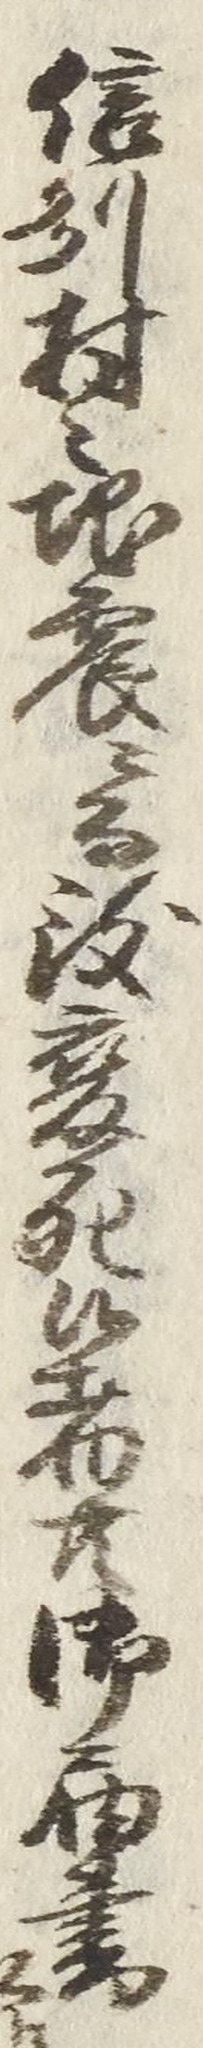信州村々地震ニ而致変死候者共御届書
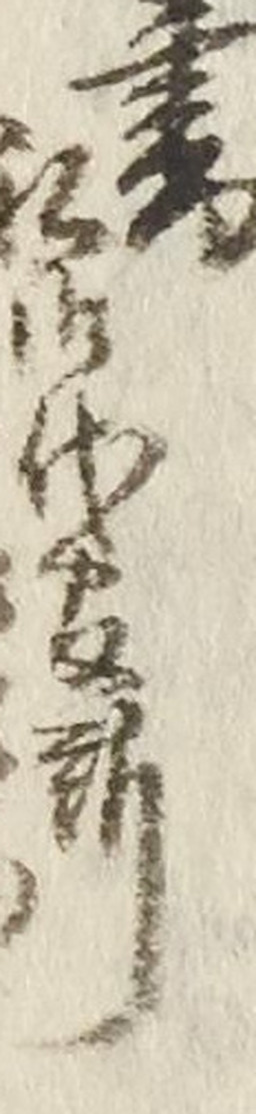私御代官所
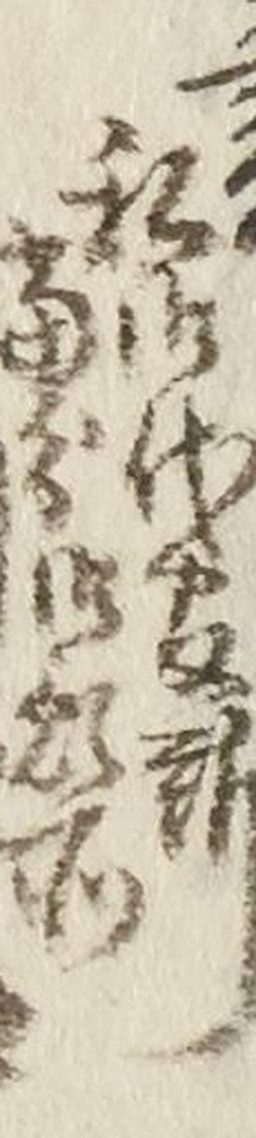当分御預所
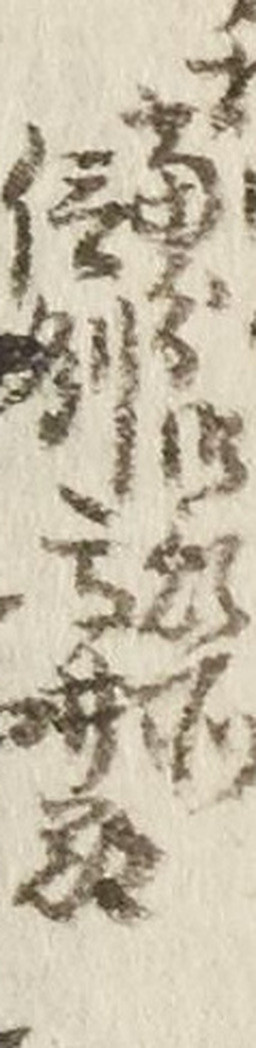信州高井郡
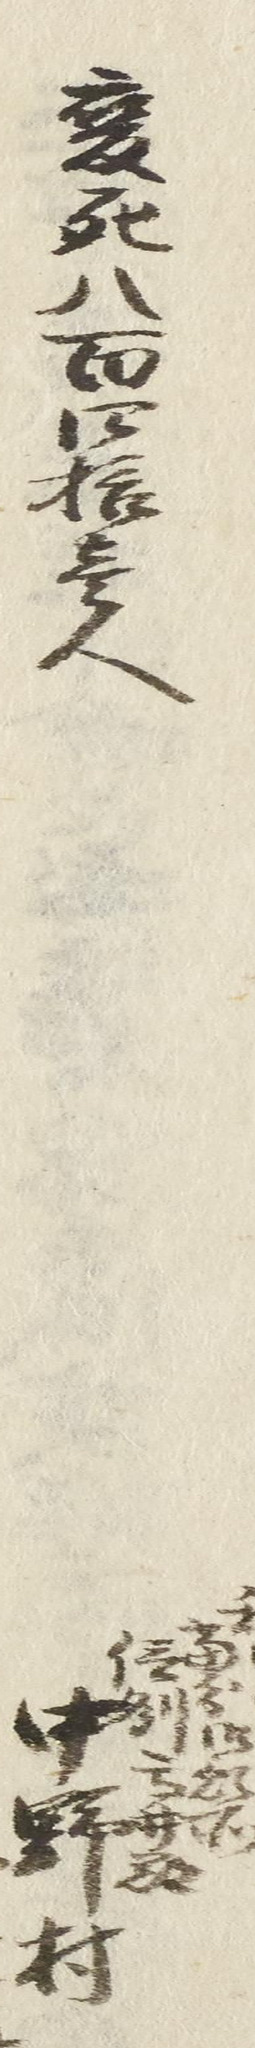一変死八百四拾壱人中野村
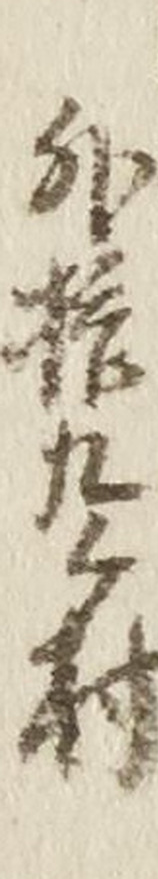外拾九ヶ村
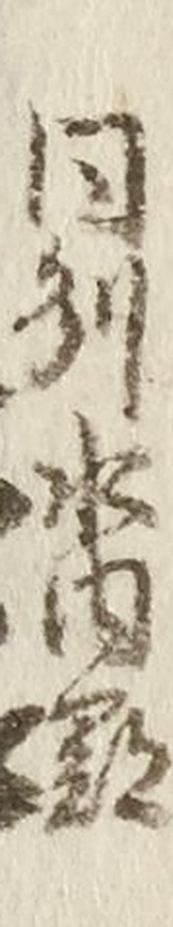同州水内郡
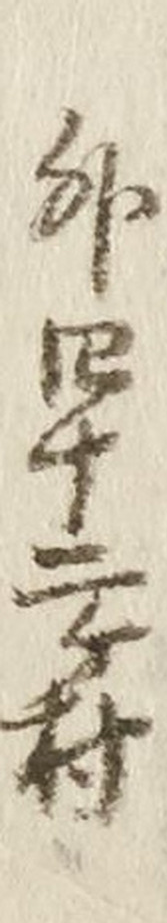外四十二ヶ村
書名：従往古地震御届書記誌之一
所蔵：東京大学地震研究所図書室 Earthquake Research Institute Library, The University of Tokyo, JAPAN
